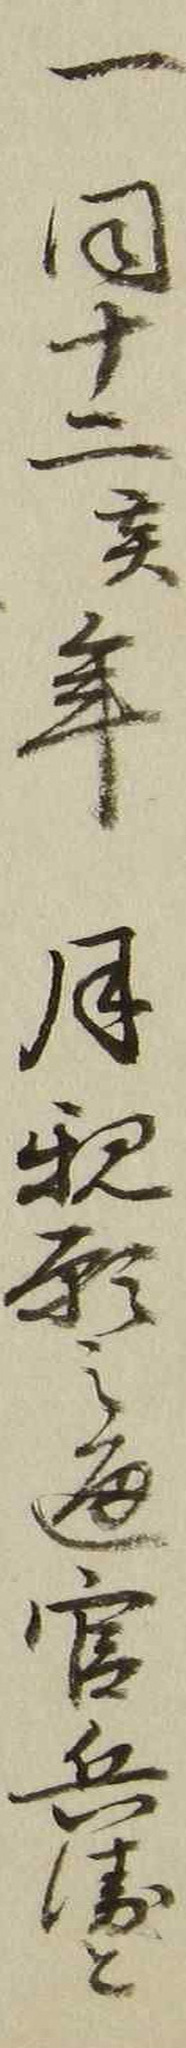一同十二亥年月親願之通官兵衛と
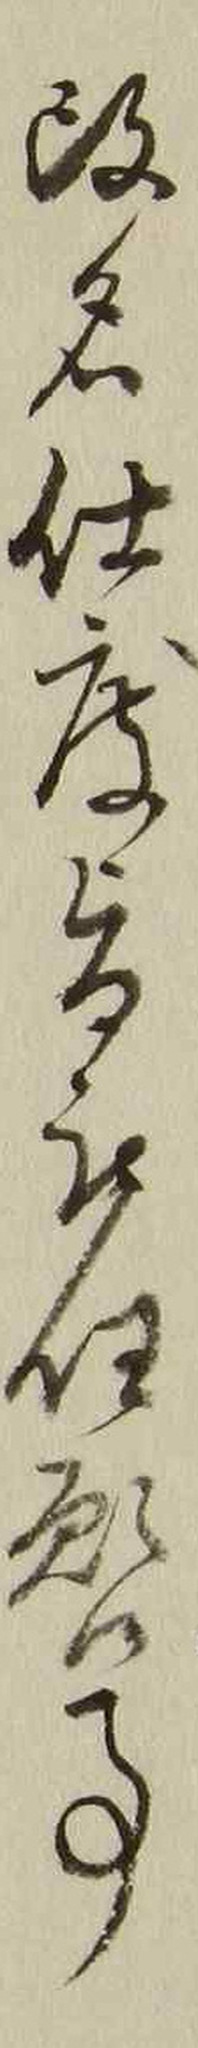改名仕度旨被任願候事
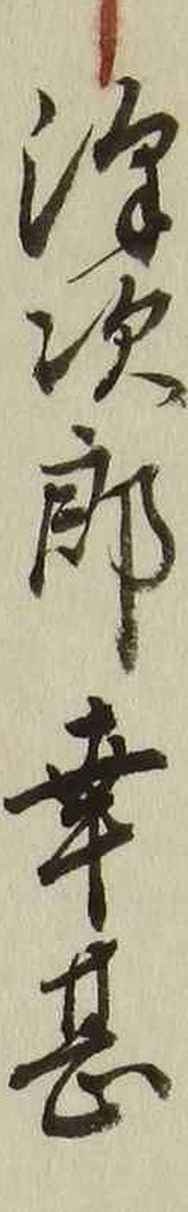沢次郎幸甚
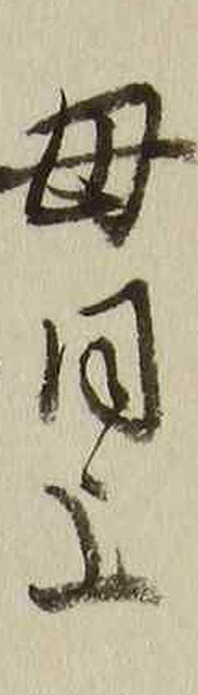母同上
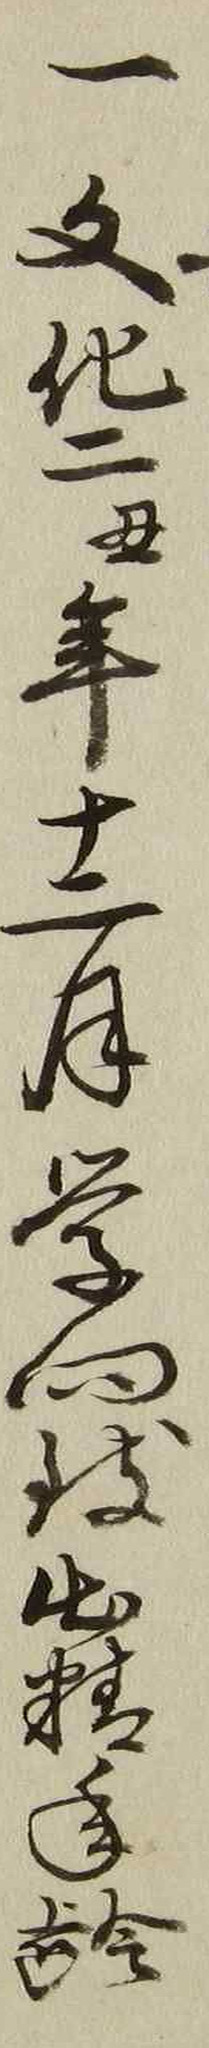一文化二丑年十二月学向致出精年齢
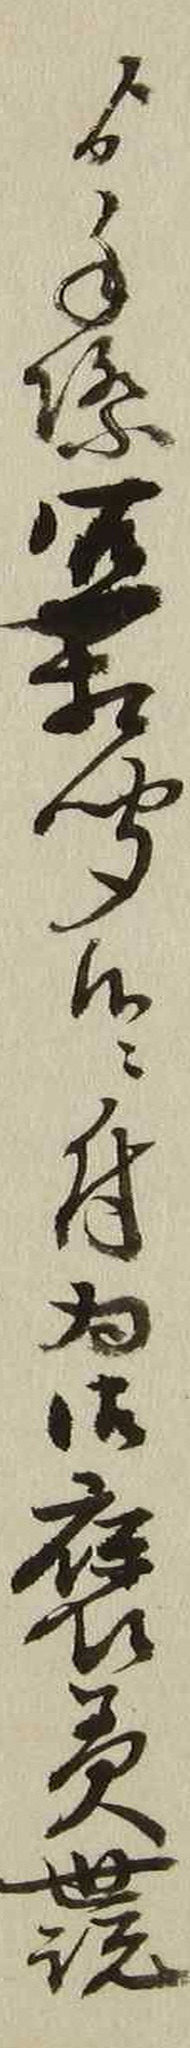ゟ手際宜相聞候ニ付為御褒美世説
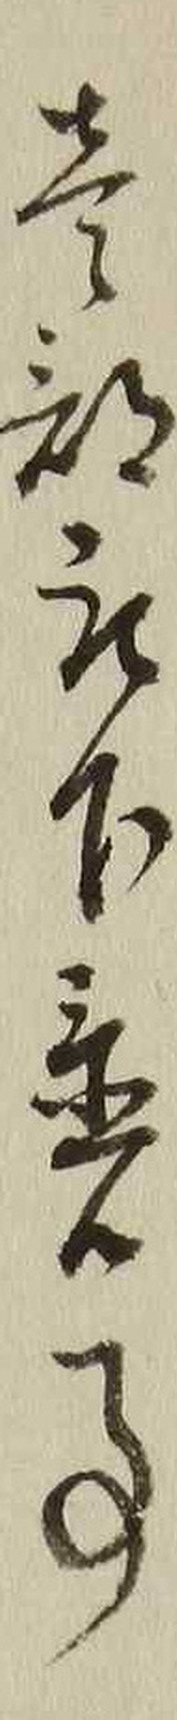壱部被下置候事
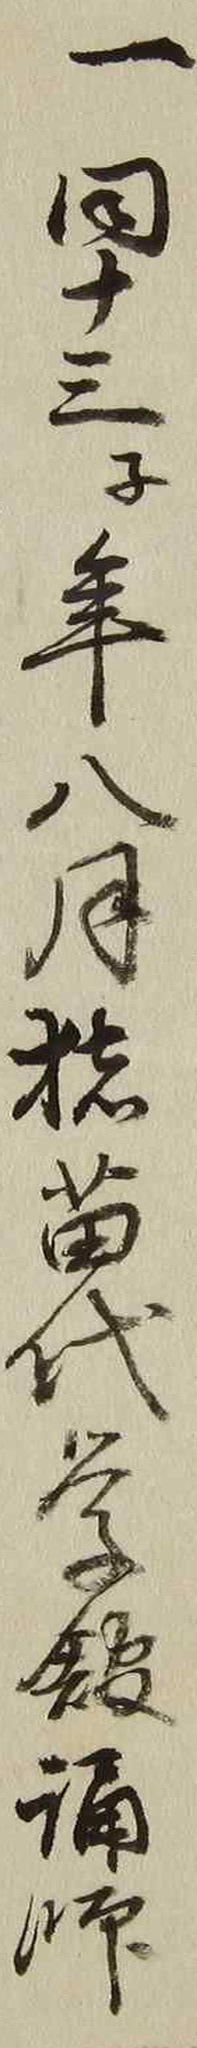一同十三子年八月猪苗代学館誦師
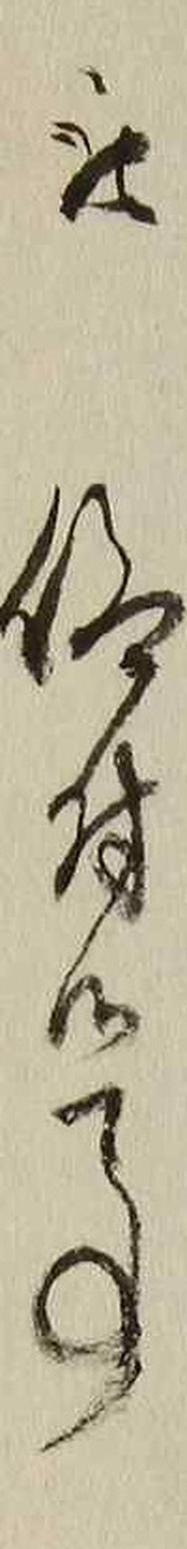被仰付候事
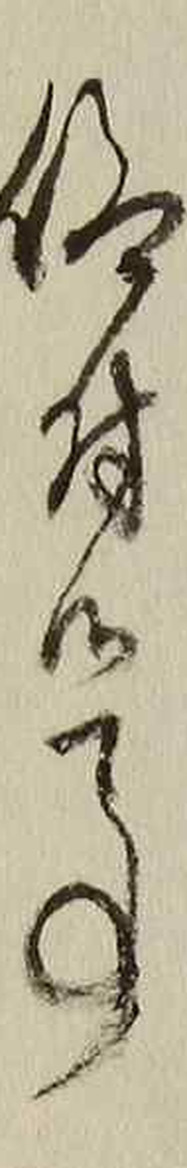仰付候事
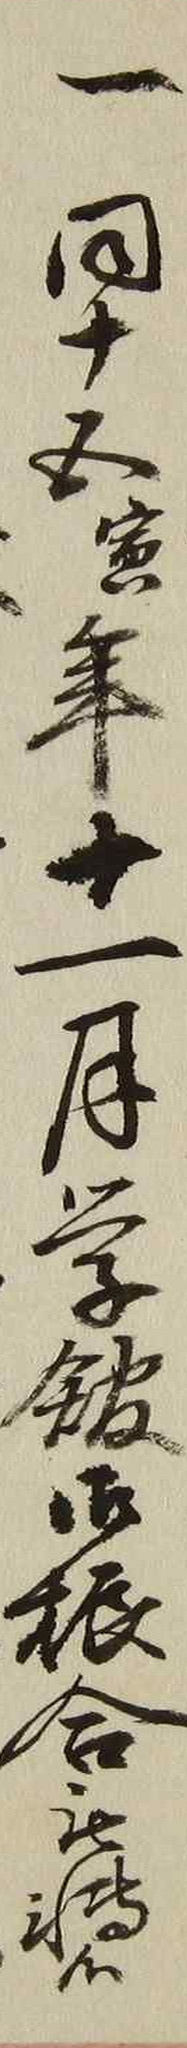一同十五寅年十一月学館御振合被転候
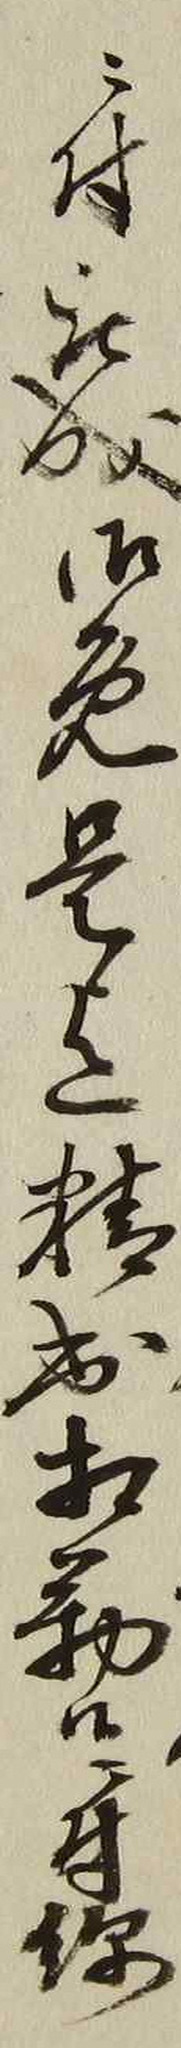ニ付被成御免是迄精出相勤候ニ付綿
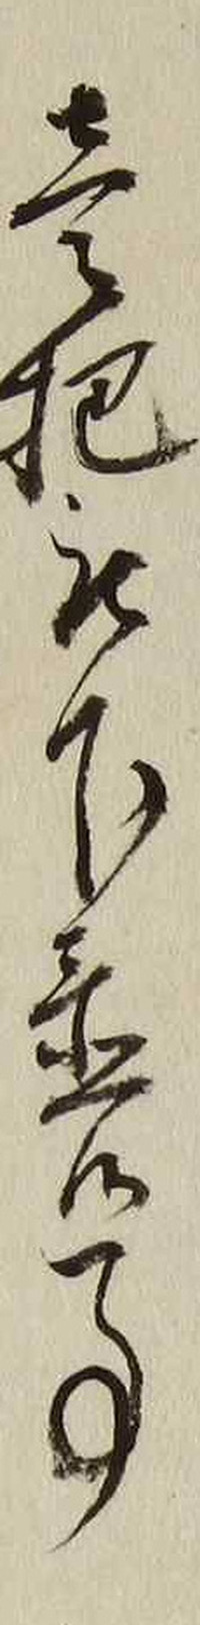壱把被下置候事
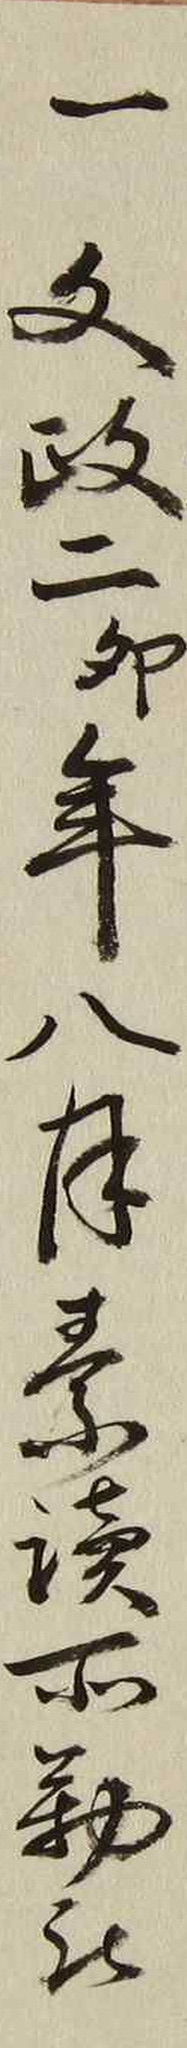一文政二卯年八月素読所勤被
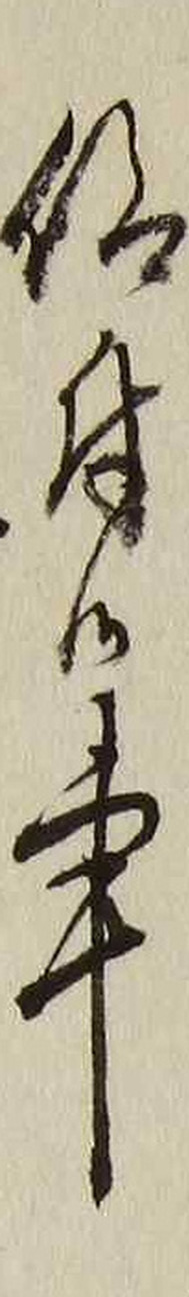仰付候事
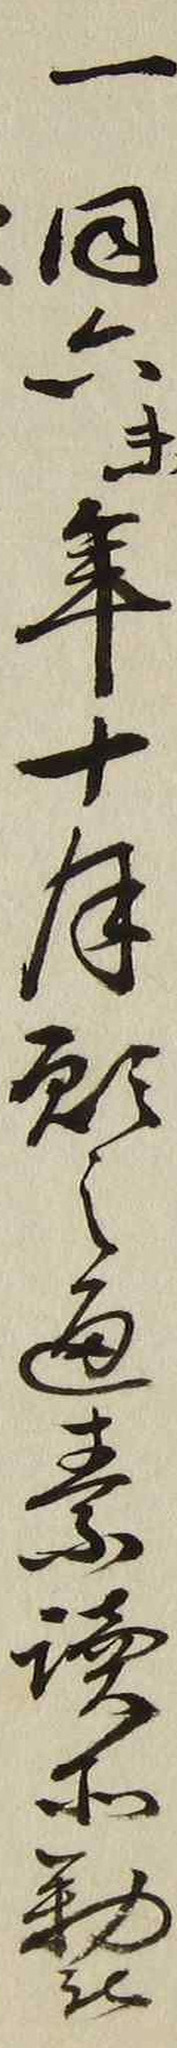一同六未年十月願之通素読所勤被
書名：諸士系譜　巻之35　は之部3
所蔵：会津若松市立会津図書館
